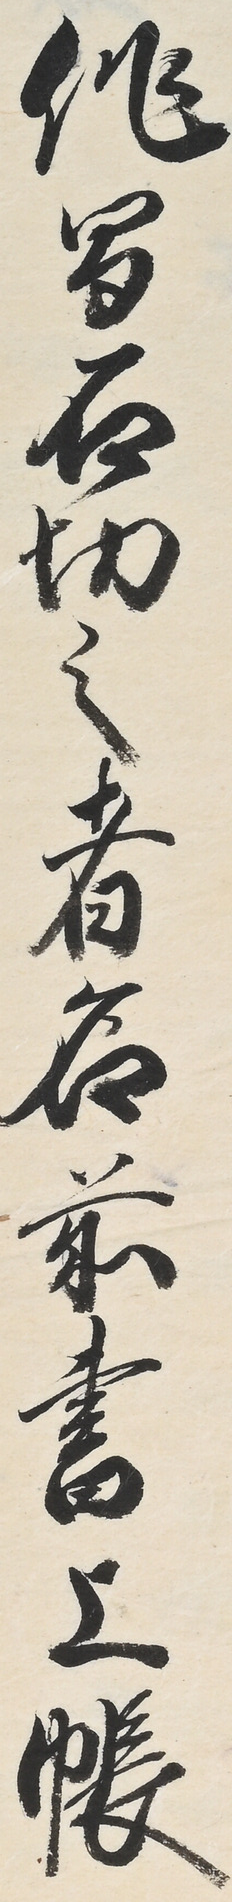作間石切之者名前書上帳
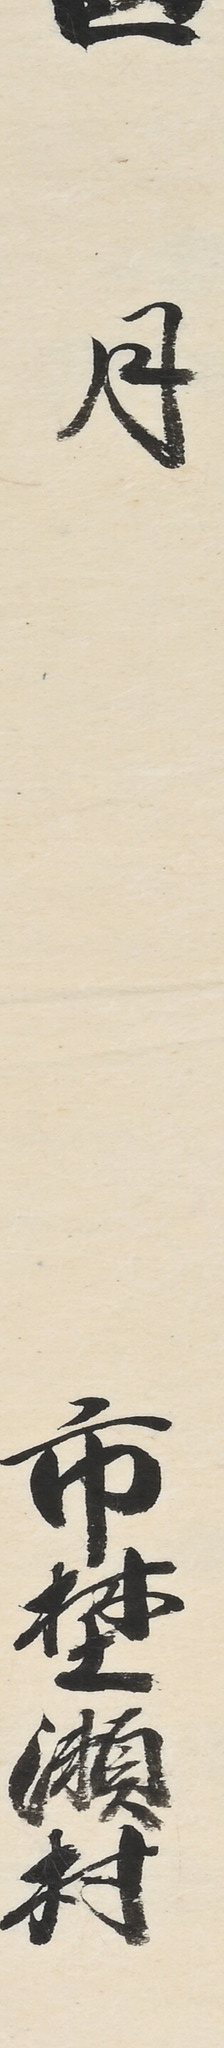四月市埜瀬村

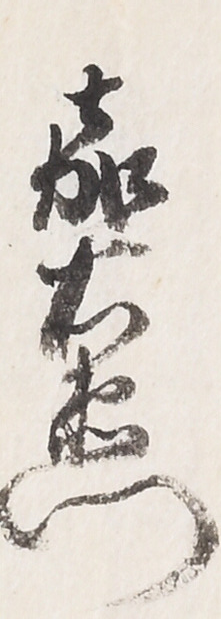嘉右衛門
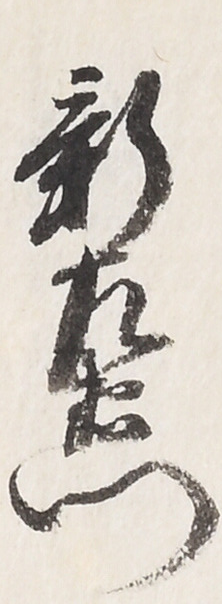新左衛門

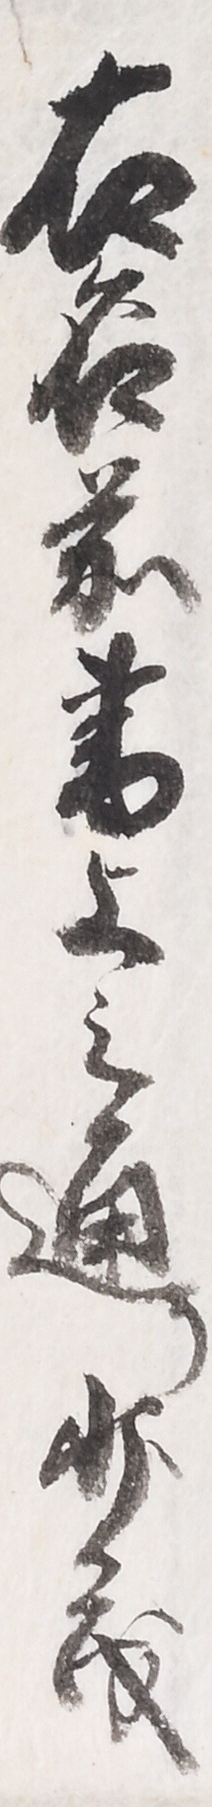右名前書上之通り少茂
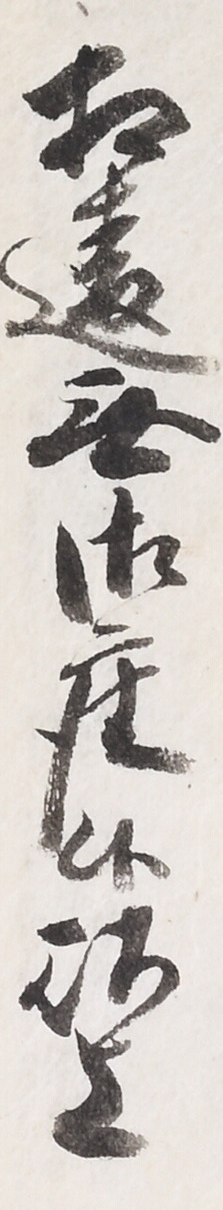相違無御座候以上
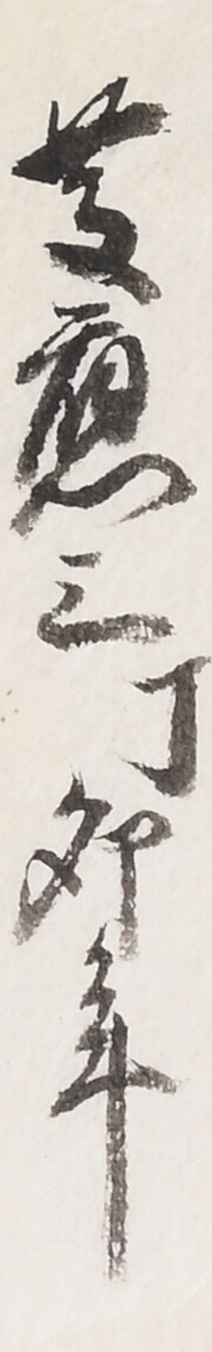慶應三丁卯年
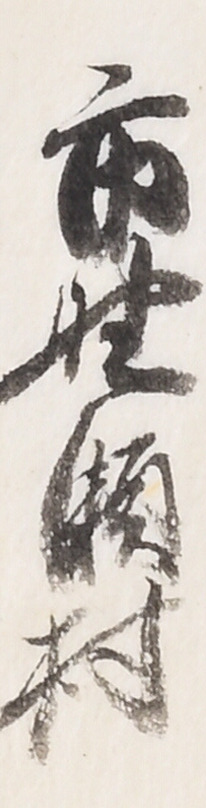市野瀬村
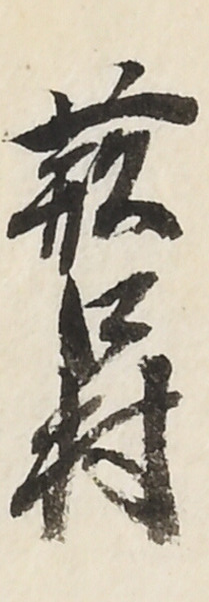荊口村
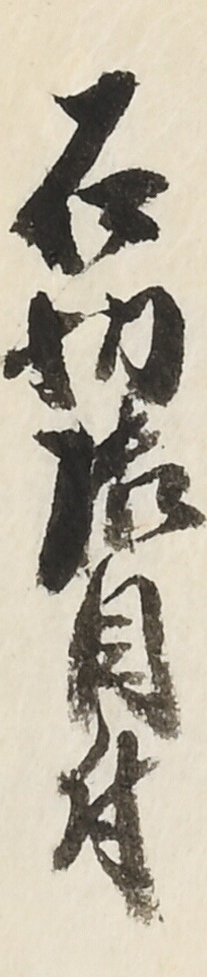石切御目付
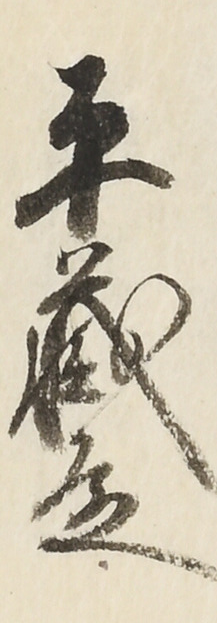平蔵殿
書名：慶應三丁卯年四月作間石切之者名前書上帳
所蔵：伊那市立高遠町図書館・合同会社AMANE
